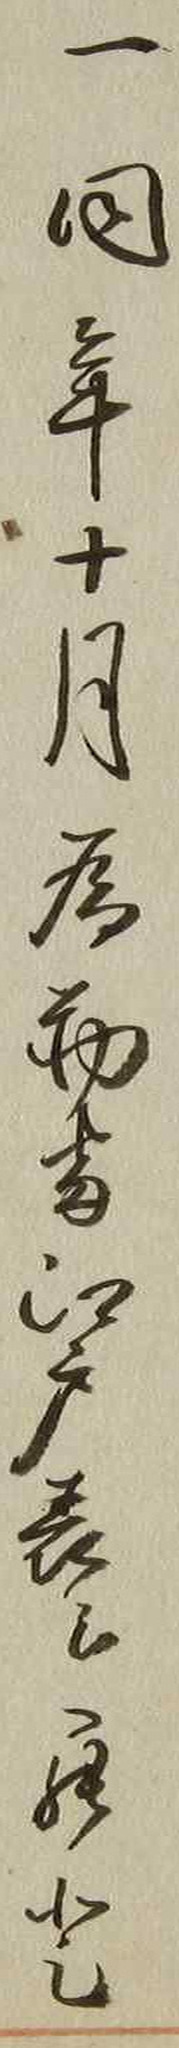一同年十月為勤番江戸表江罷登
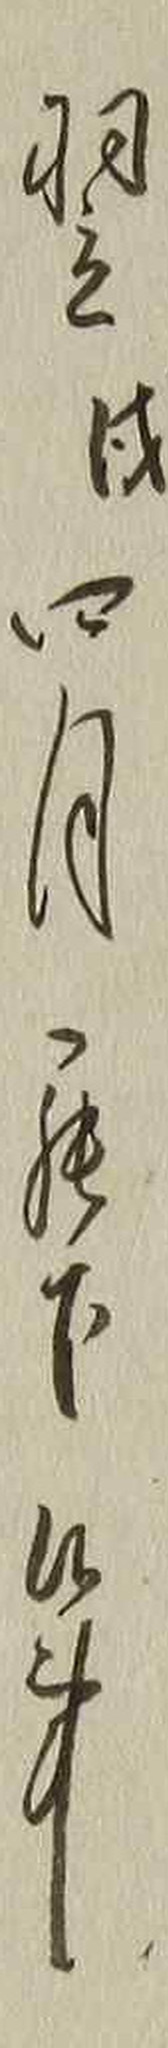翌戌四月罷下候事
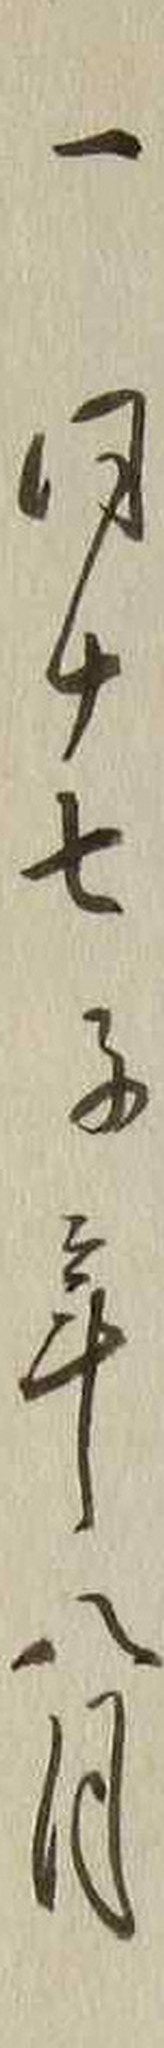一同十七子年八月
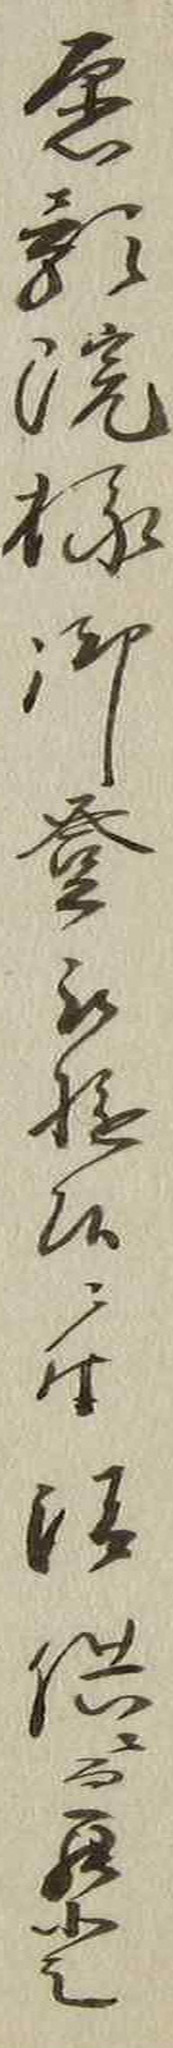愿彰院様御登被遊候ニ付御供ニ而罷登
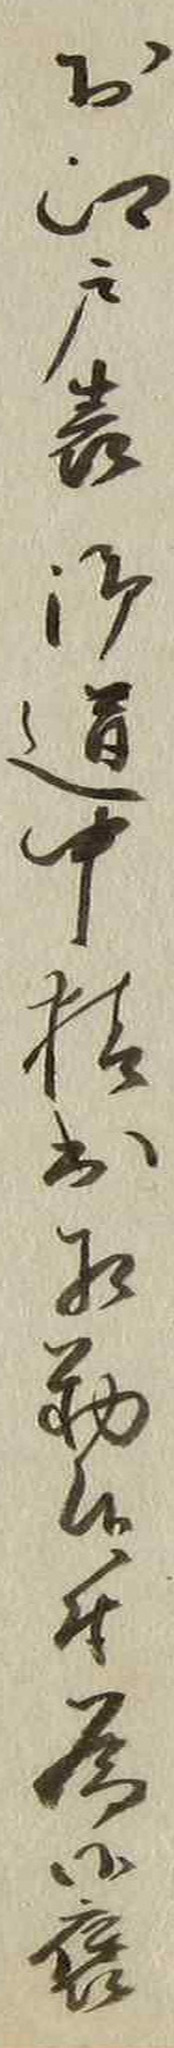於江戸表御道中精出相勤候ニ付為御褒
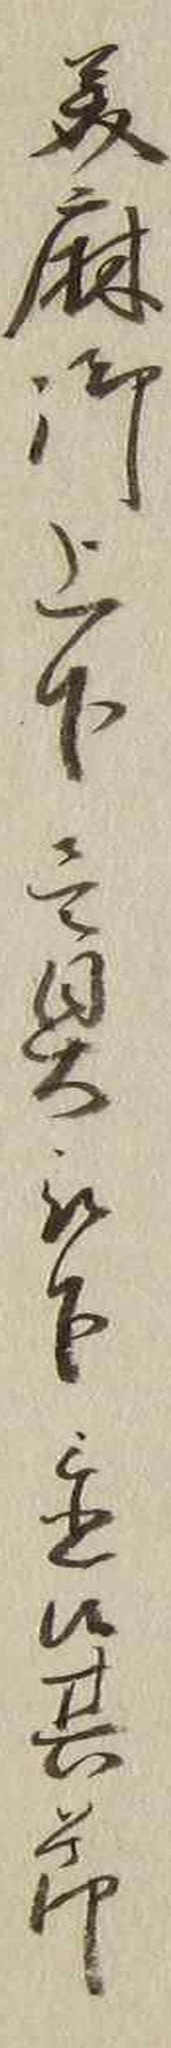美麻御上下壱具被下置候其節
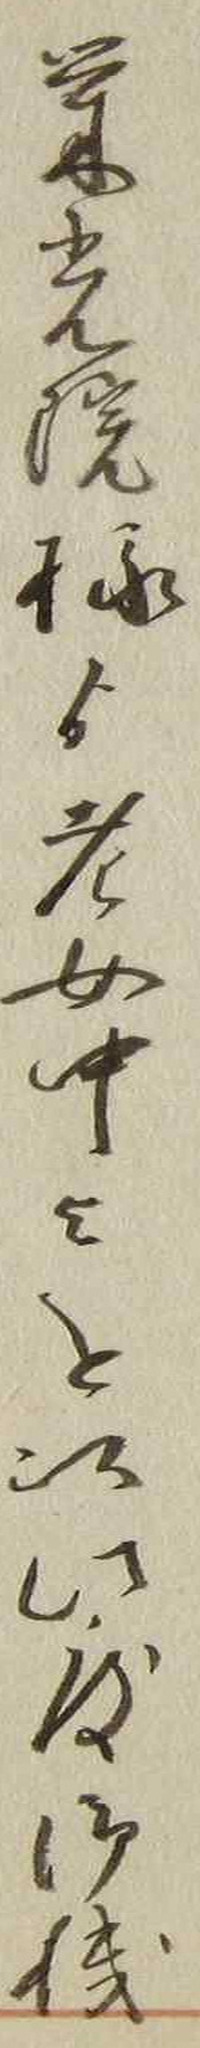栄光院様ゟ老女中与を以此度御機
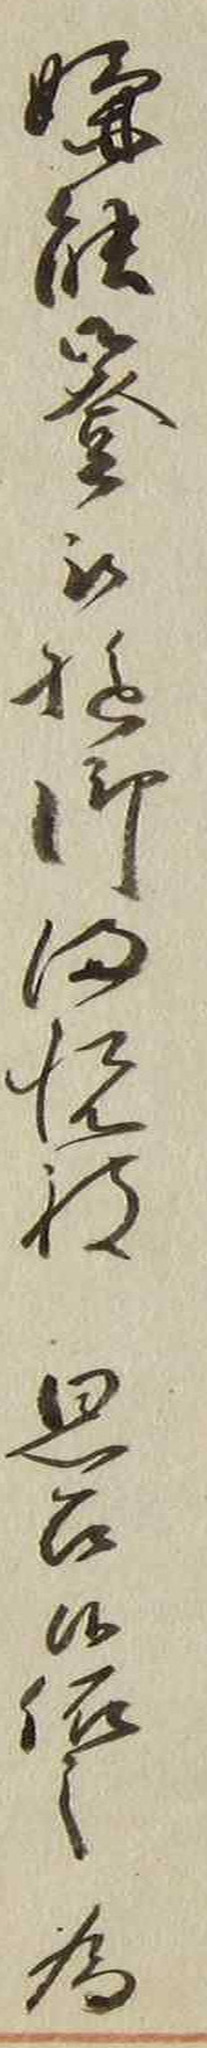嫌能御登被遊御満悦被思召候依之為
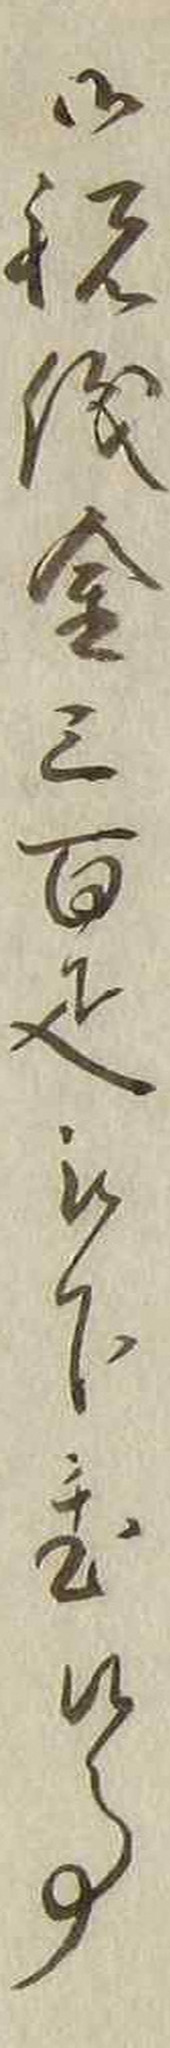御祝儀金三百疋被下置候事
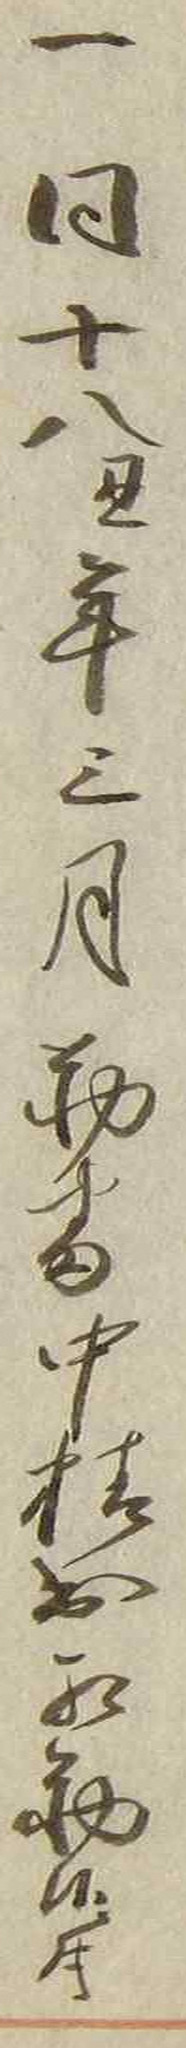一同十八丑年三月勤番中精出相勤候ニ付

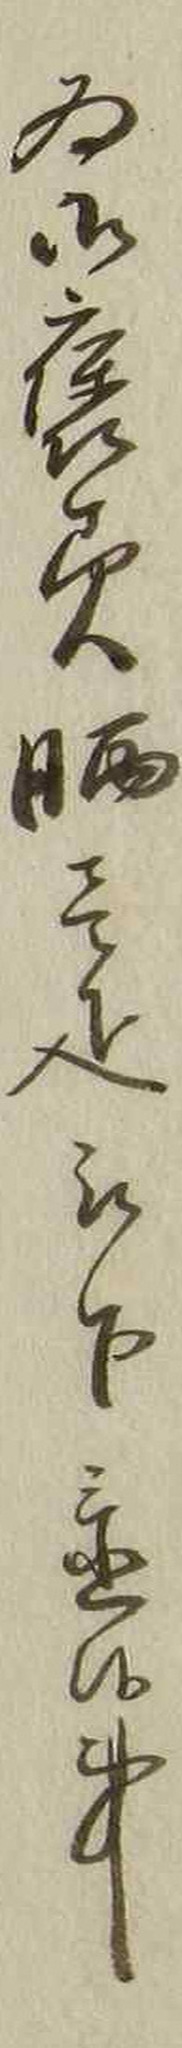為御褒美晒壱疋被下置候事
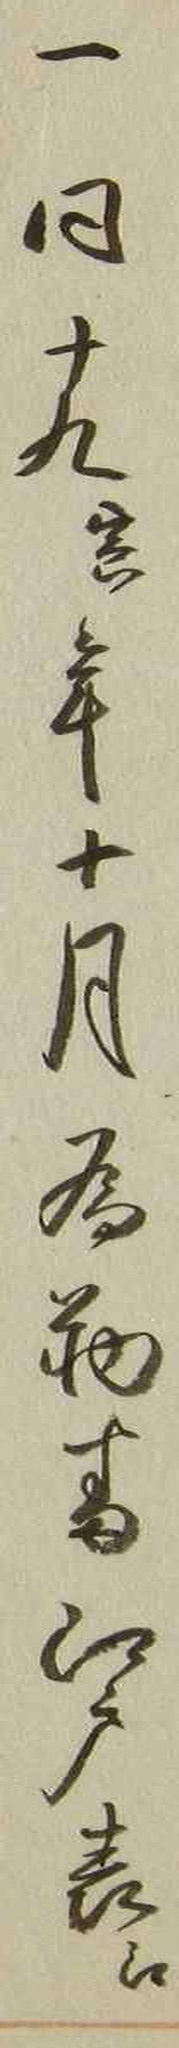一同十九寅年十月為勤番江戸表江
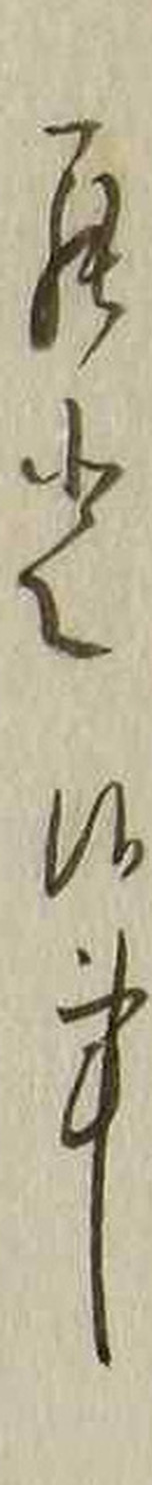罷登候事
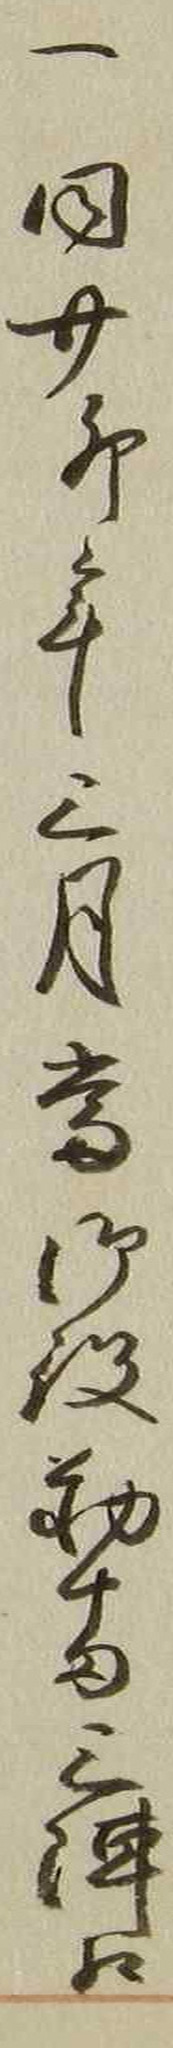一同廿卯年三月当御役勤番三陣相
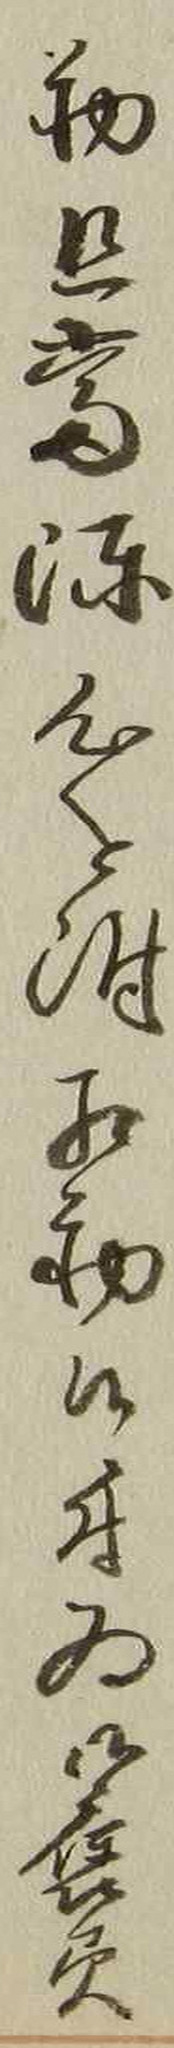勤且当陣心を附相勤候ニ付為御褒美
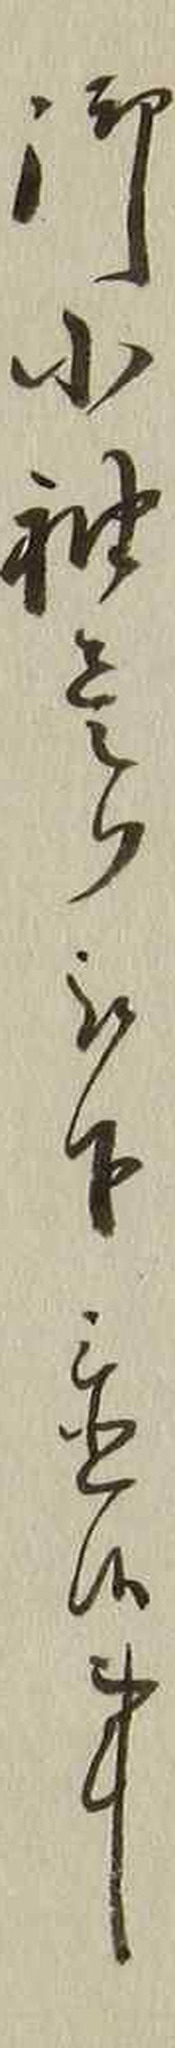御小袖壱ツ被下置候事
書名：諸士系譜　巻之122　よ之部5
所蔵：会津若松市立会津図書館
